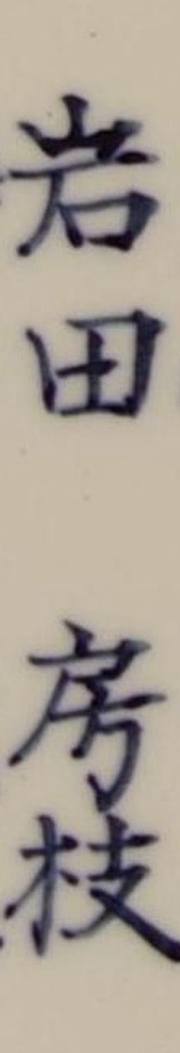岩田房枝
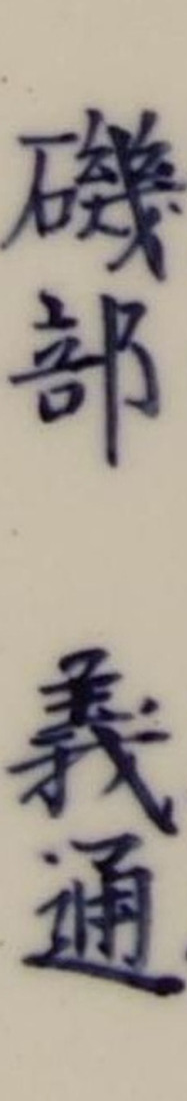磯部義通
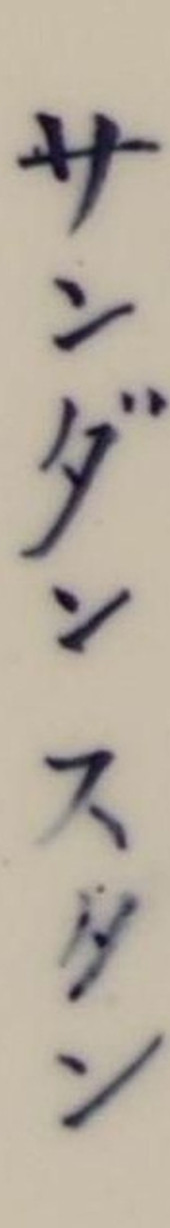サンダンスタン
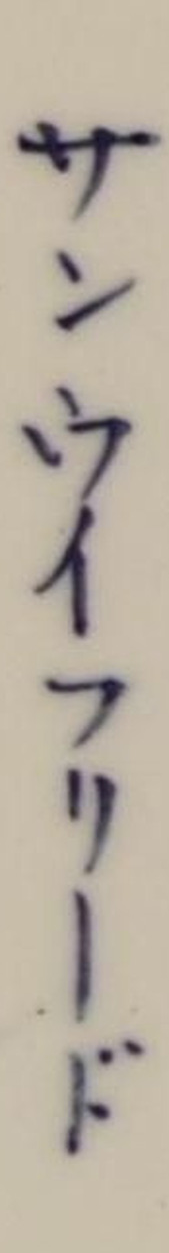サンウイフリード
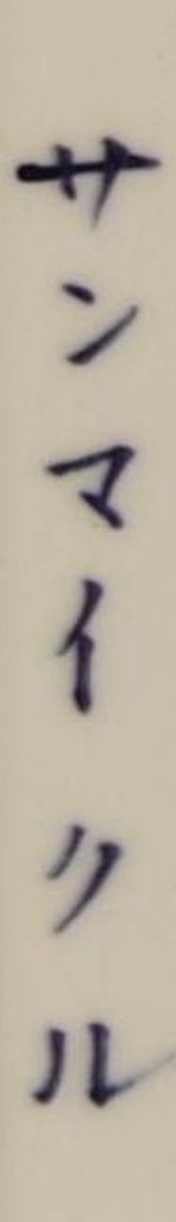サンマイクル

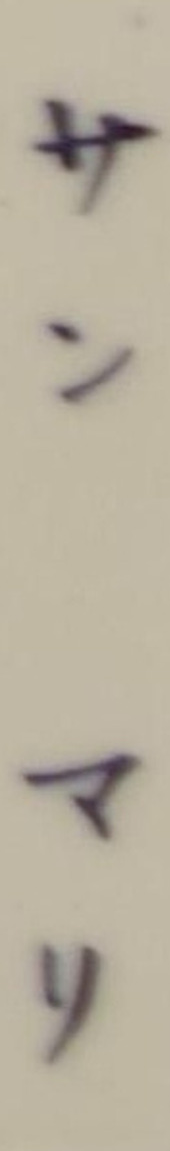サンマリ
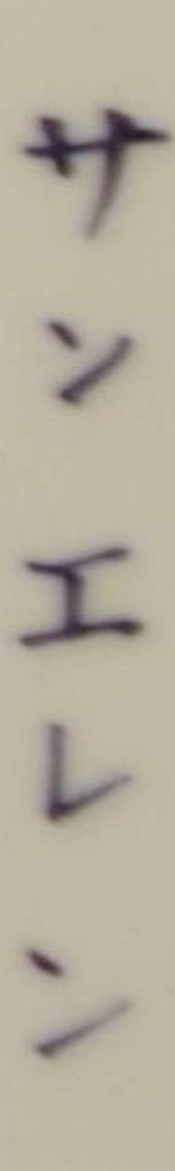サンエレン
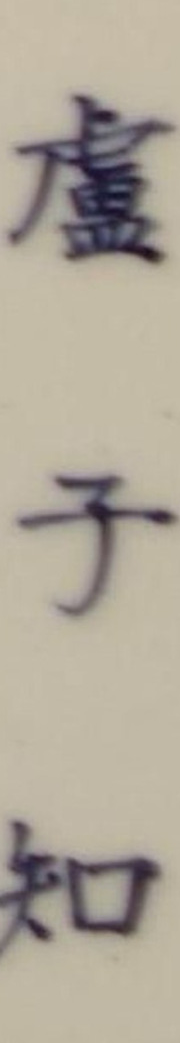盧子知
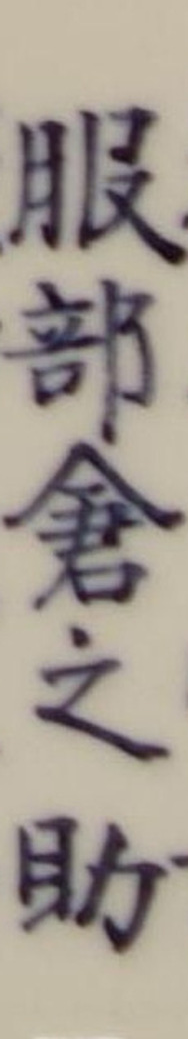服部倉之助
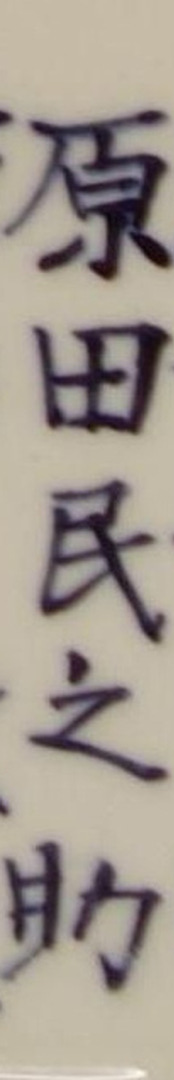原田民之助
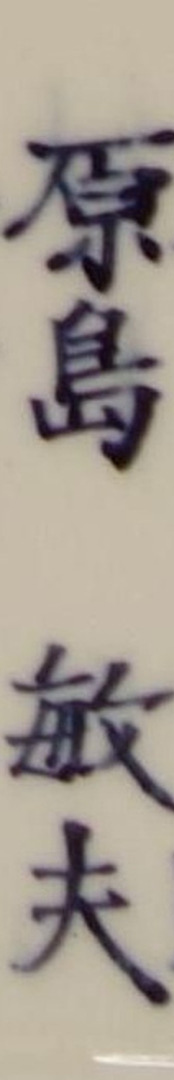原島敏夫
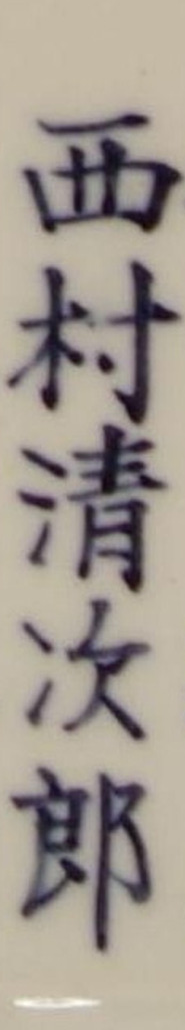西村清次郎
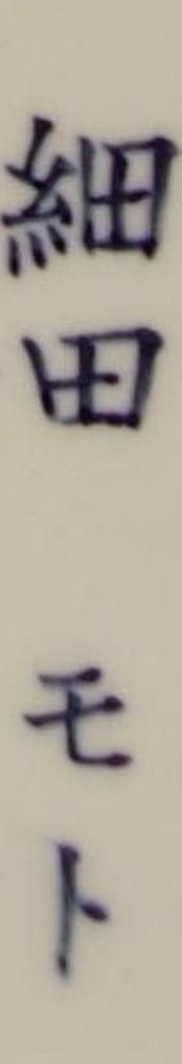細田モト
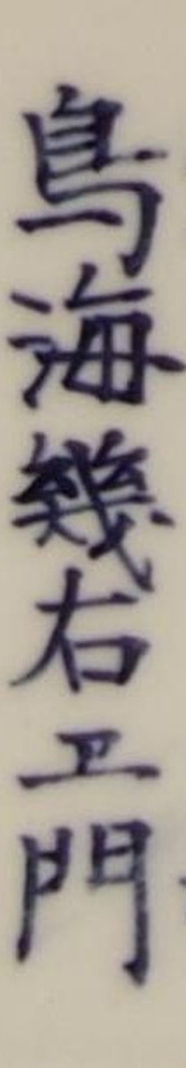鳥海幾右エ門
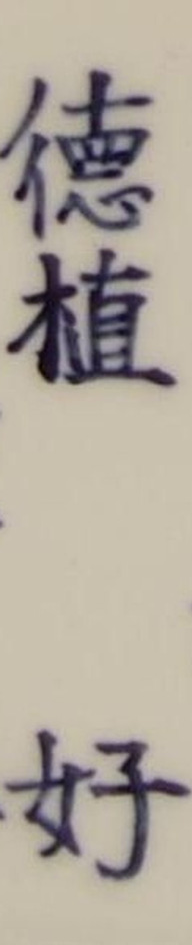徳植好
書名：M~S
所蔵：高野山金剛峯寺
